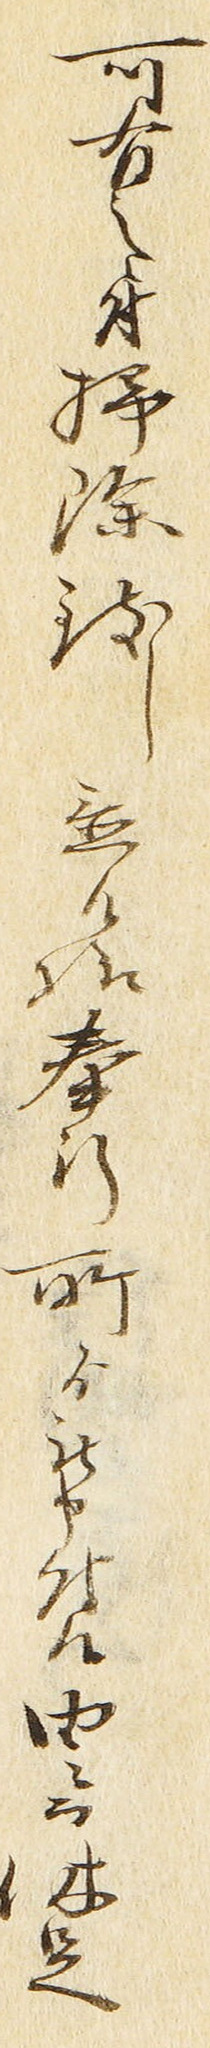可有之に付掃除致し置候様奉行所ゟ被申付候由に而休足
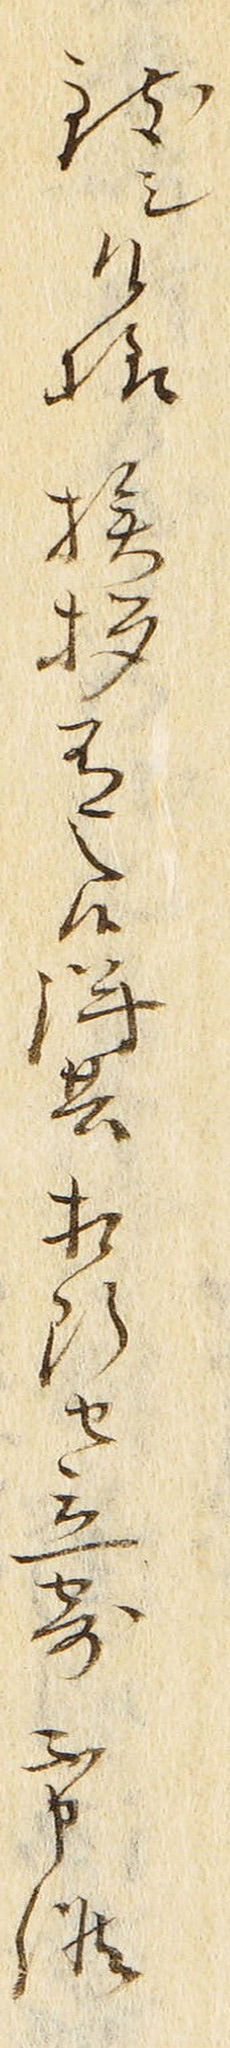致し候様挨拶有之候伴共相断せ立寄不申候
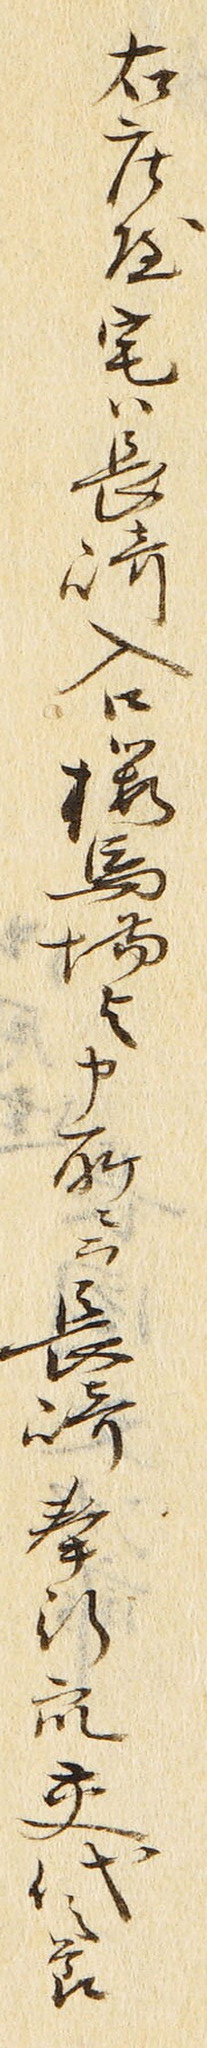右庄屋宅は長崎入口桜馬場と申所に而長崎奉行衆交代之節
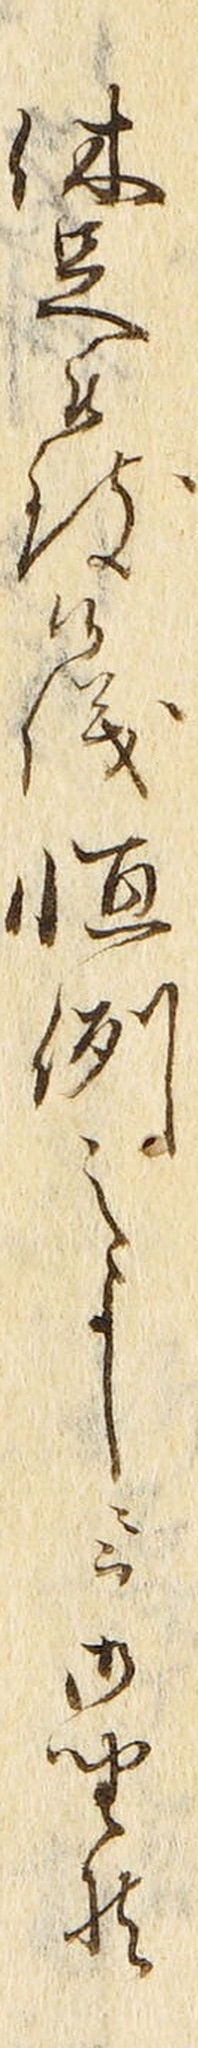休足被致候儀恒例之よしに而御座候
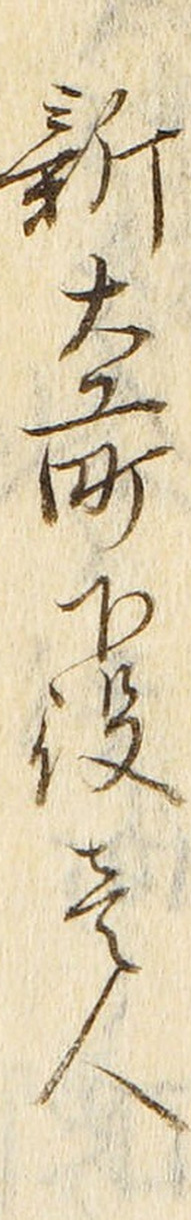新大工町下役壱人
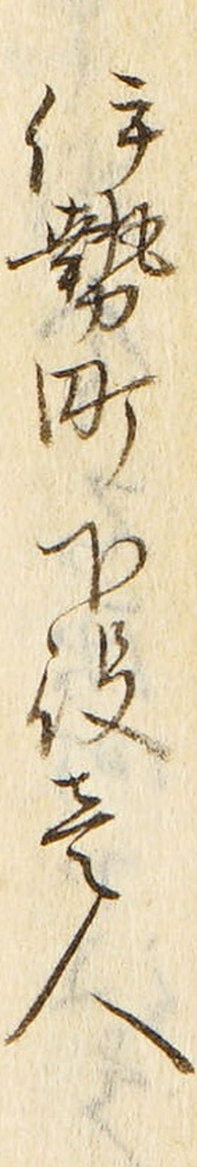伊勢町下役壱人
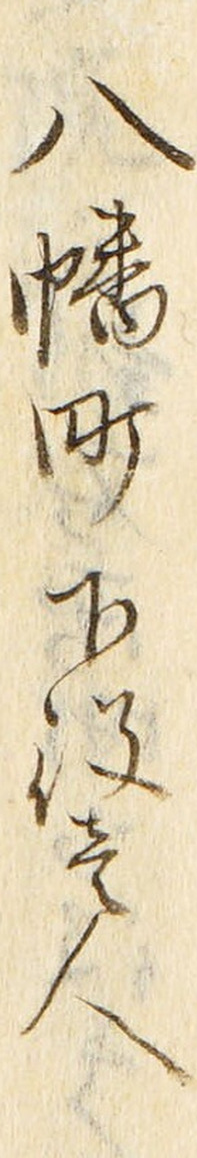八幡町下役壱人
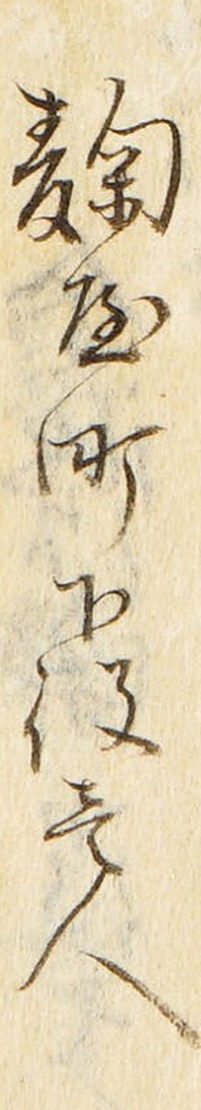麹屋町下役壱人
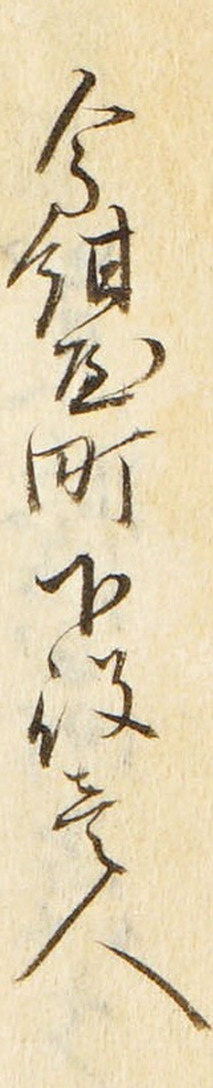今紺屋町下役壱人
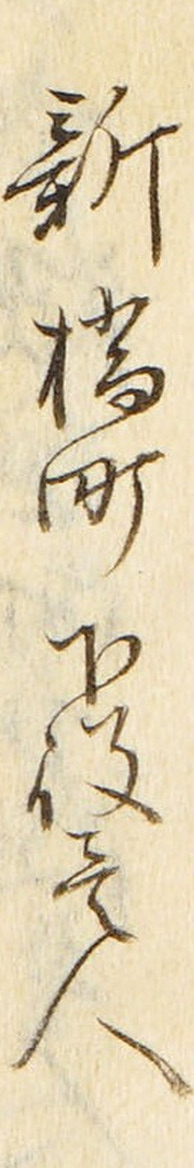新橋町下役壱人
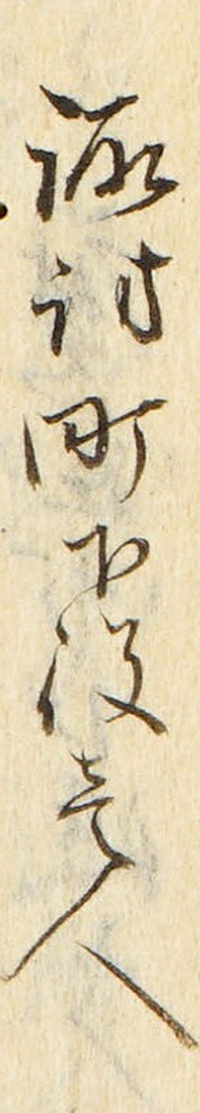諏訪町下役壱人

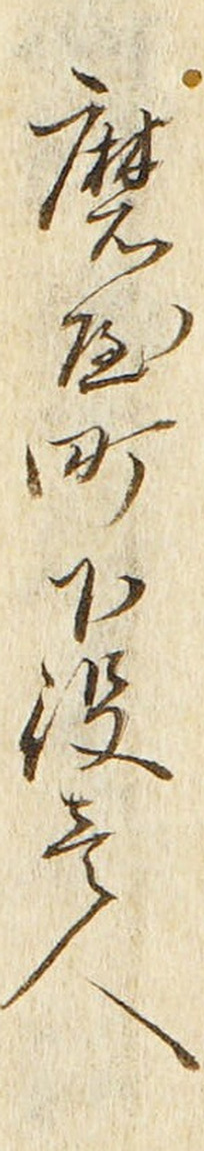磨屋町下役壱人
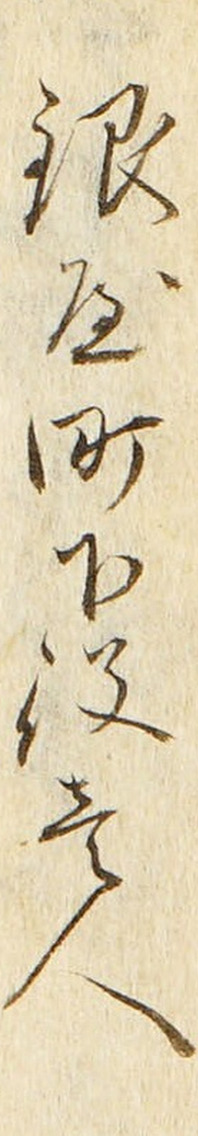銀屋町下役壱人
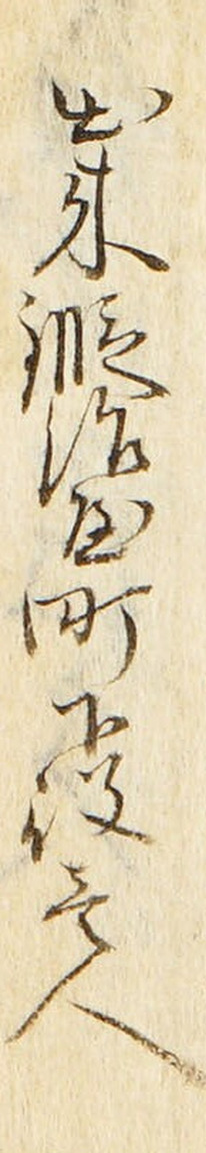歳鍛冶屋町下役壱人
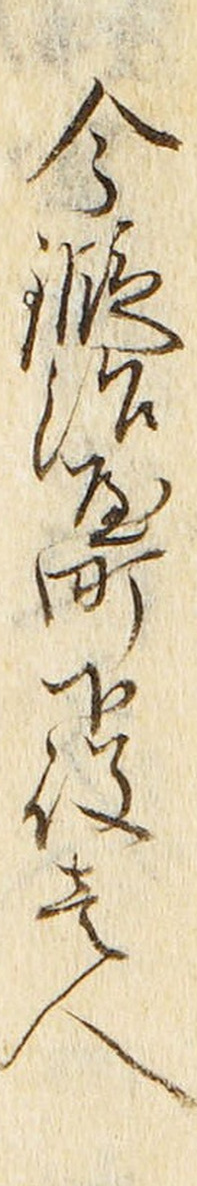今鍛冶屋町下役壱人
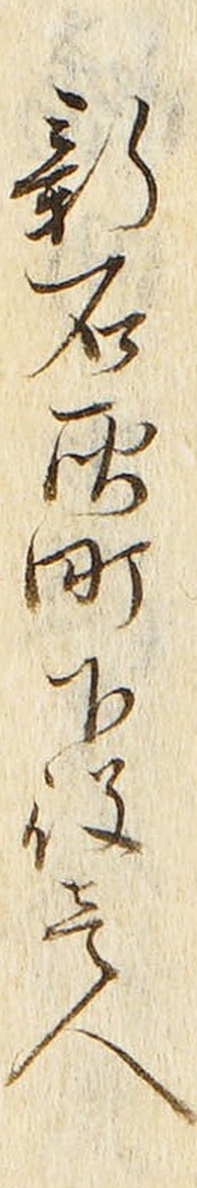新石灰町下役壱人
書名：長崎漂流記
